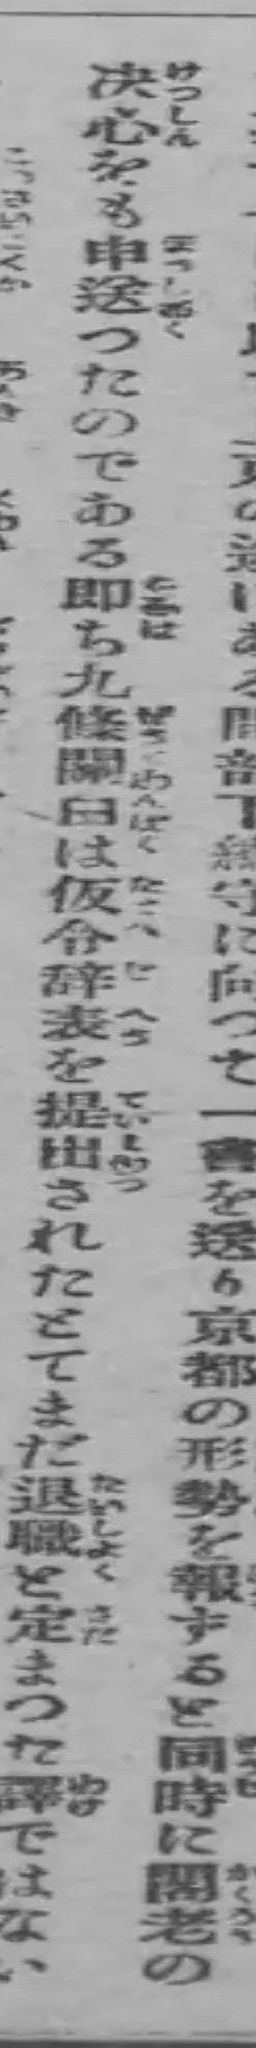決心をも申送つたのである即ち九条関白は仮令辞表を提出されたとてまだ退職と定まつた訳ではない
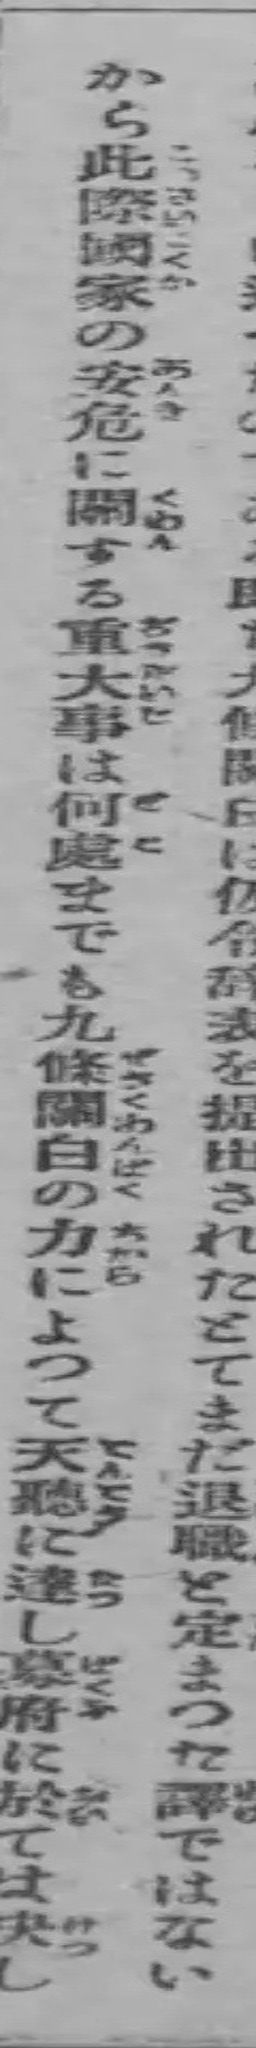から此際国家の安危に関する重大事は何処までも九条関白の力によつて天聴に達し幕府に於ては決し
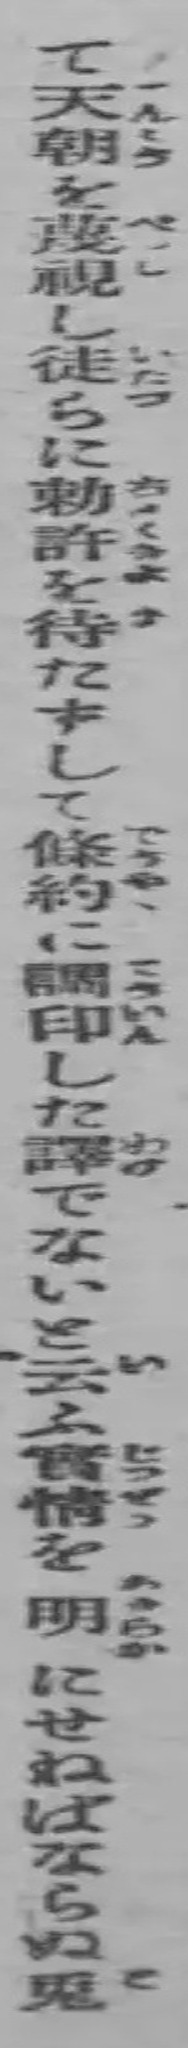て天朝を蔑視し徒らに勅許を待たずして条約に調印した訳でないと云ふ実情を明にせねばならぬ兎
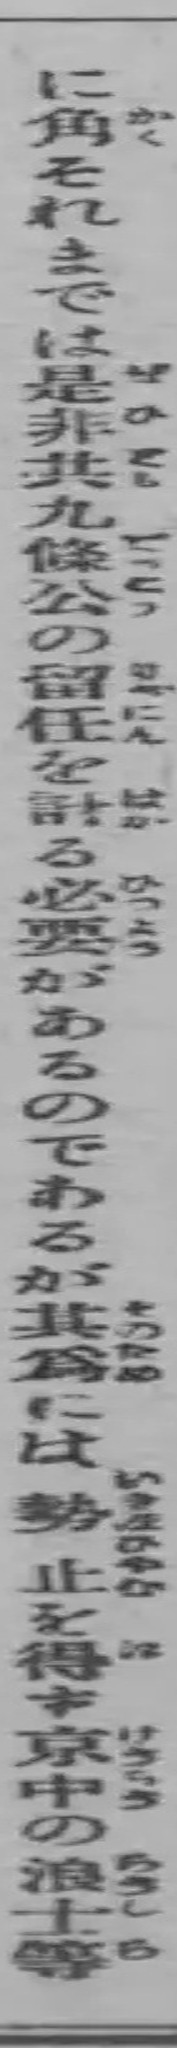に角それまでは是非共九条公の留任を計る必要があるのであるが其為には勢止を得ず京中の浪士等
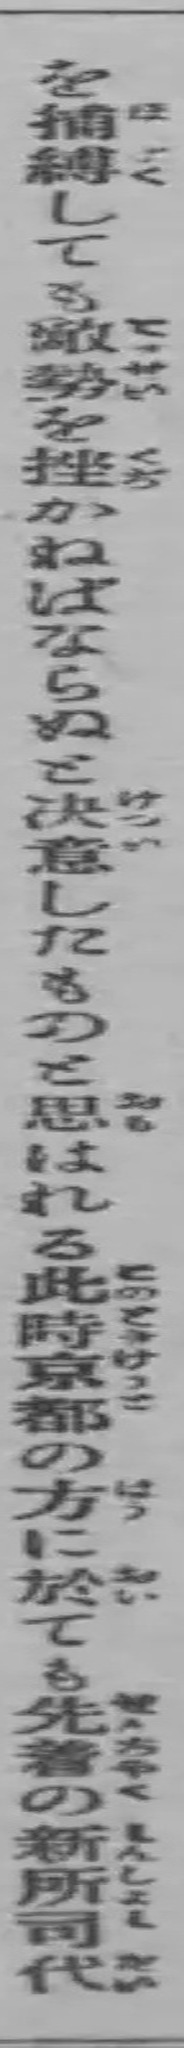を捕縛しても敵勢を挫かねばならぬと決意したものと思はれる此時京都の方に於ても先着の新所司代
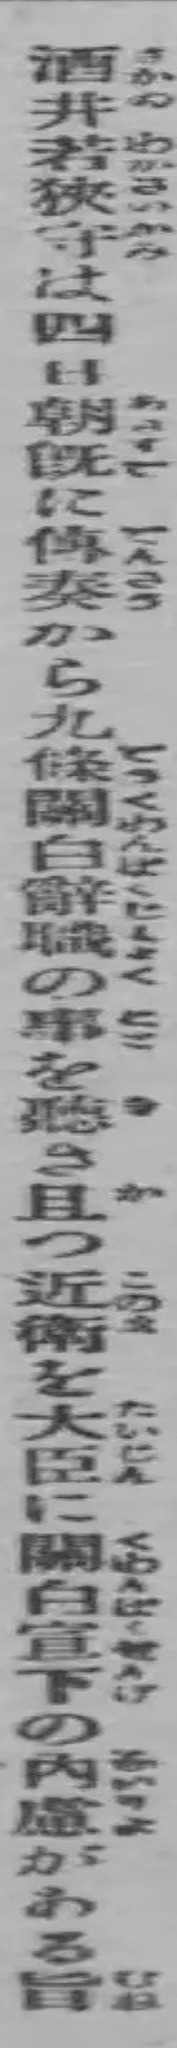酒井若狭守は四日朝既に伝奏から九条関白辞職の事を聴き且つ近衛を大臣に関白宣下の内慮がある旨
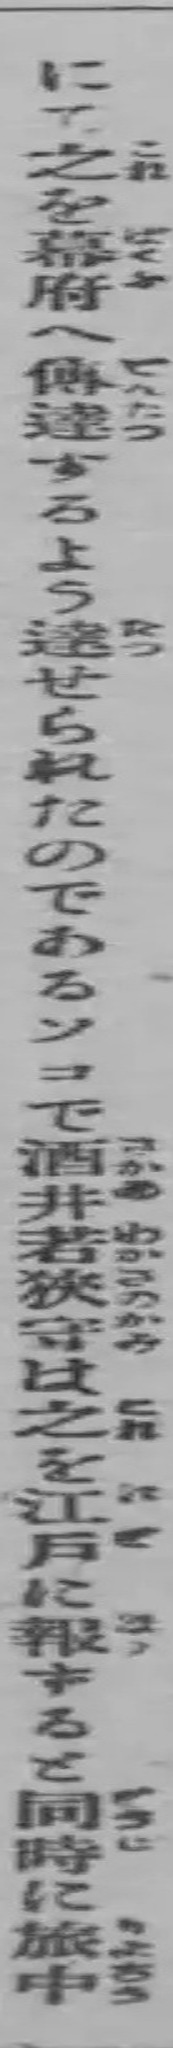にて之を幕府へ伝達するよう達せられたのであるソコで酒井若狭守は之を江戸に報ずると同時に旅中
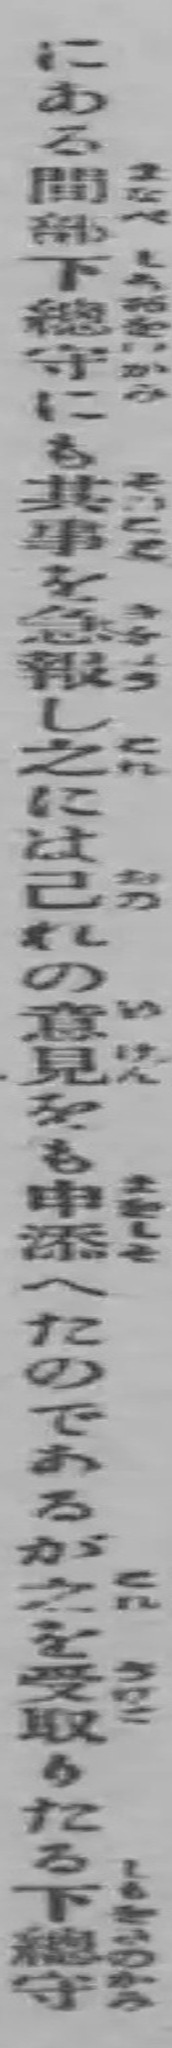にある間部下総守にも其事を急報し之には己れの意見をも申添へたのであるが之を受取りたる下総守
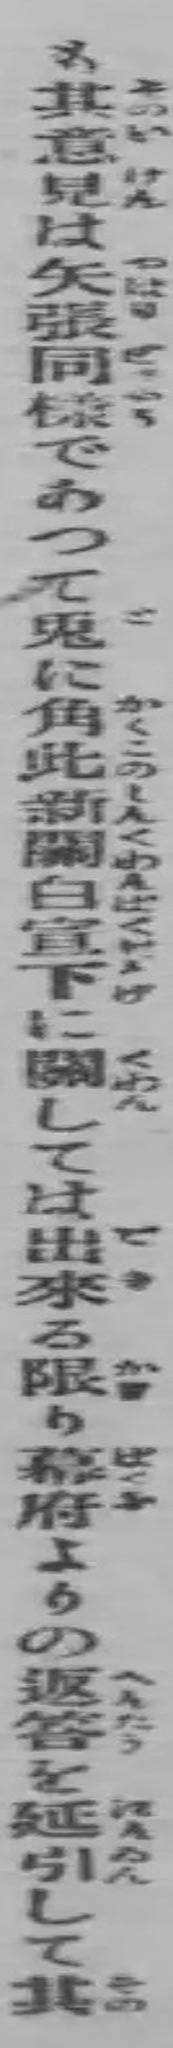も其意見は矢張同様であつて兎に角此新関白宣下に関しては出来る限り幕府よりの返答を延引して其
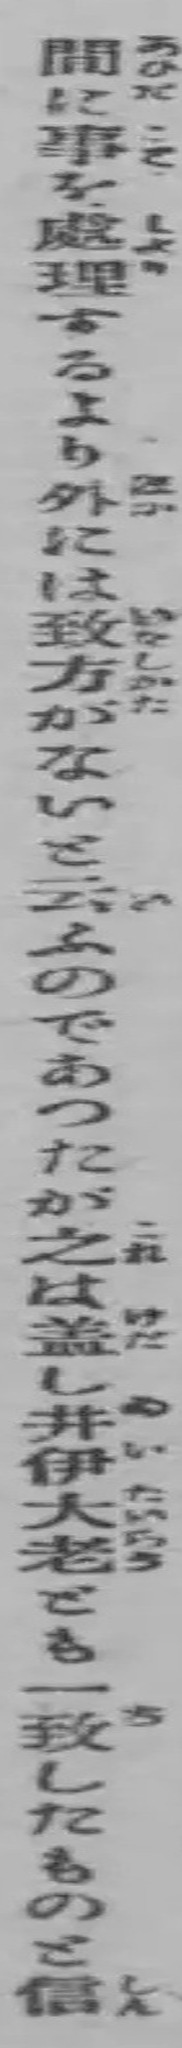間に事を処理するより外には致方がないと云ふのであつたが之は蓋し井伊大老とも一致したものと信
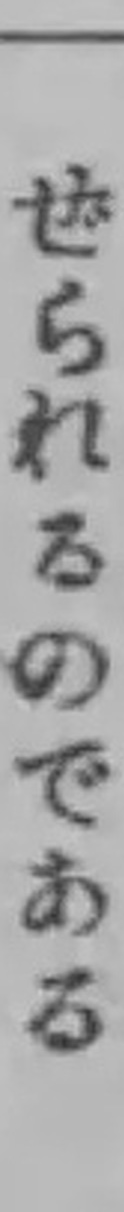ぜられるのである
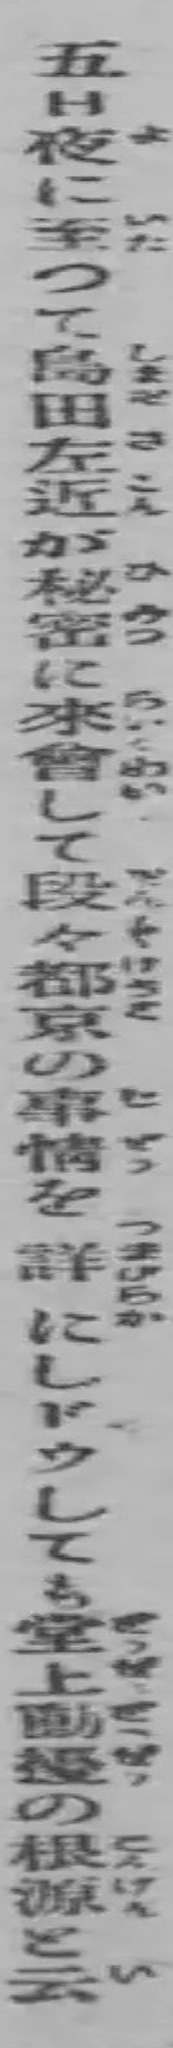五日夜に至つて島田左近が秘密に来会して段々京都の事情を詳にしドウしても堂上動擾の根源と云
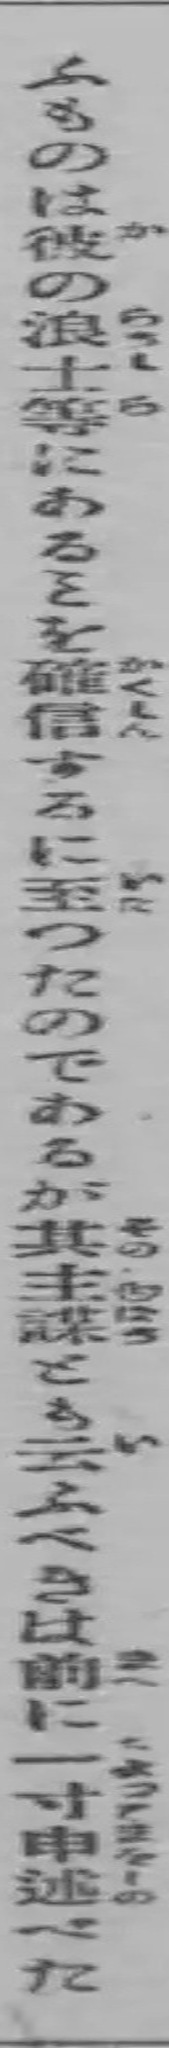ふものは彼の浪士等にあることを確信するに至つたのであるが其首謀とも云ふべきは前に一寸申述べた
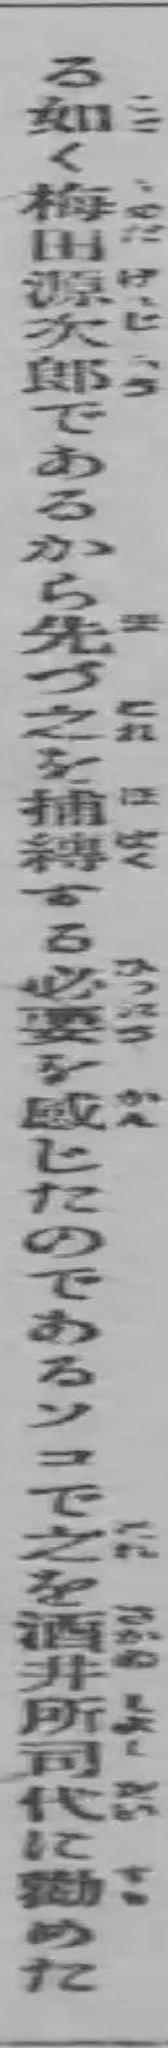る如く梅田源次郎であるから先づ之を捕縛する必要を感じたのであるソコで之を酒井所司代に勧めた
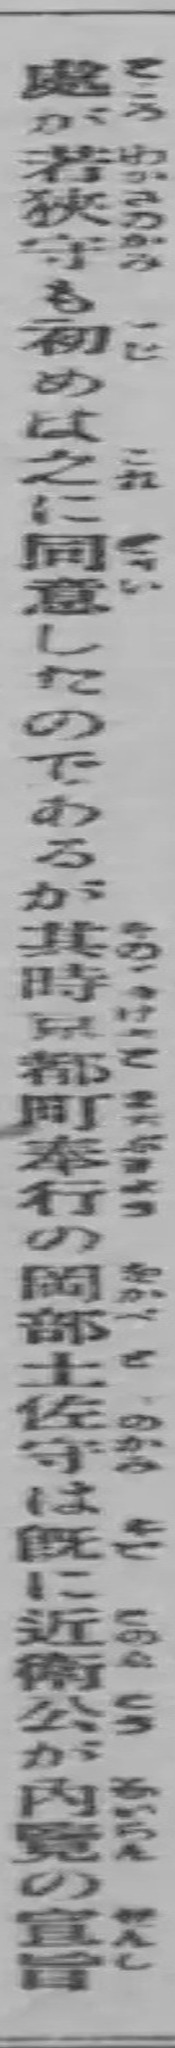処が若狭守も初めは之に同意したのであるが其時京都町奉行の岡部土佐守は既に近衛公が内覧の宣旨
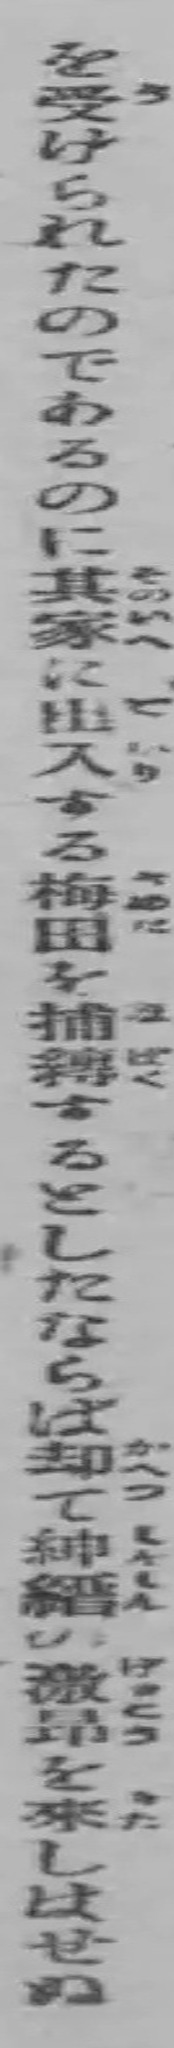を受けられたのであるのに其家に出入する梅田を捕縛するとしたならば却て紳縉の激昂を来しはせぬ
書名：豊橋市史談
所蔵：国立国会図書館 National Diet Library, JAPAN
